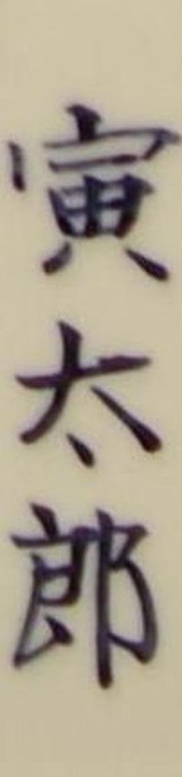寅太郎
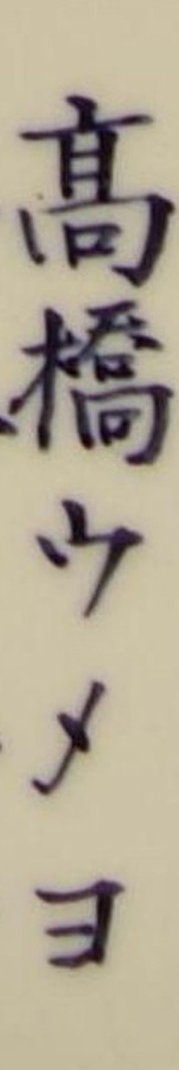高橋ウメヨ
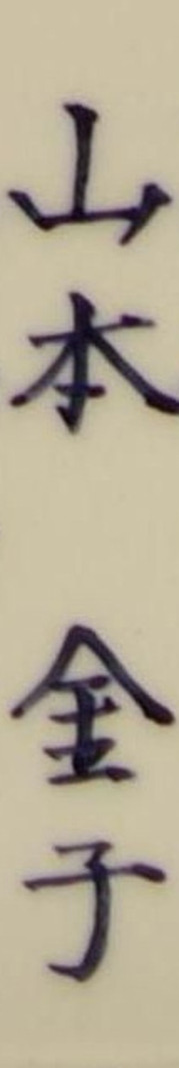山本金子
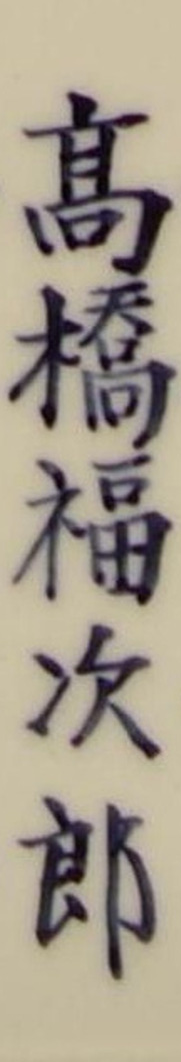高橋橘次郎
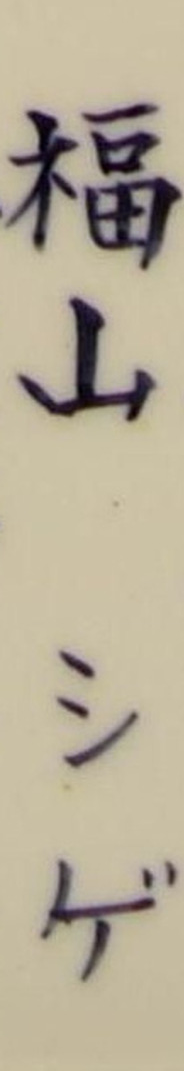福山シゲ
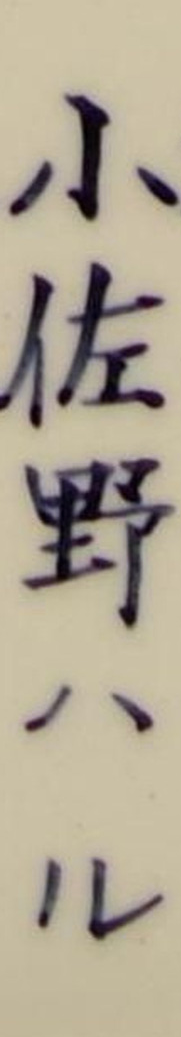小佐野ハル
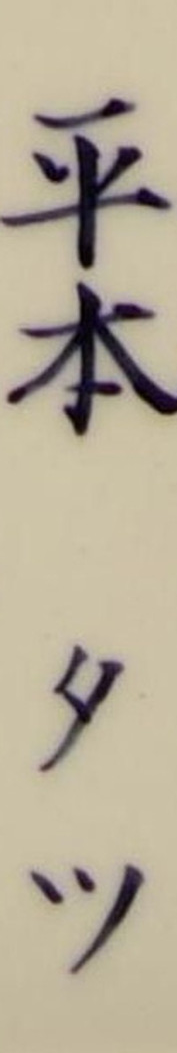平本タツ
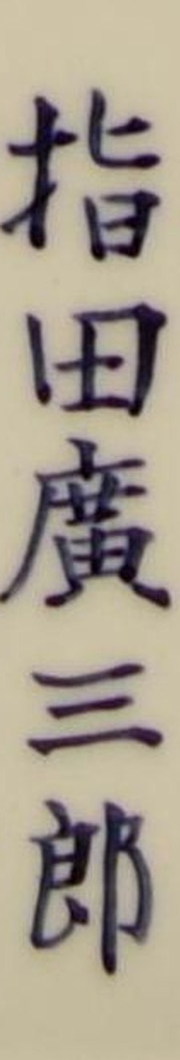指田廣三郎
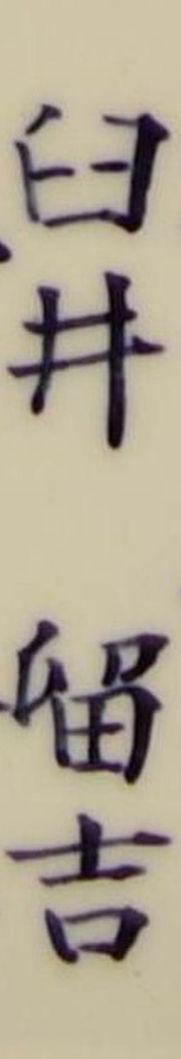臼井留吉
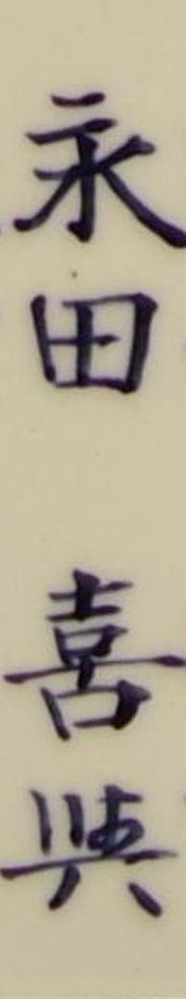永田喜興
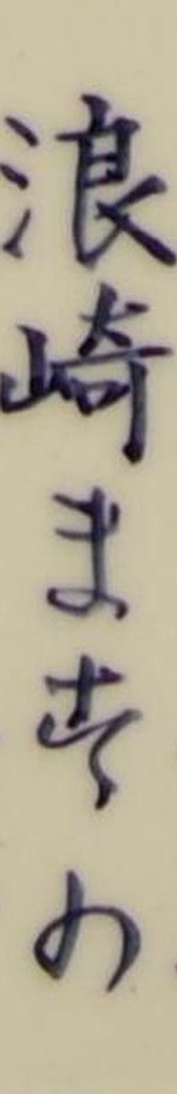浪崎ますの
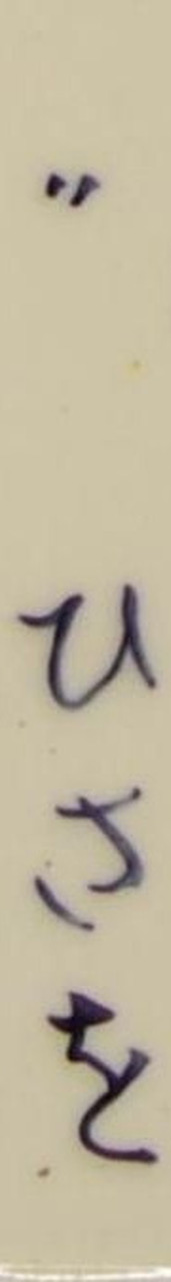ひさを
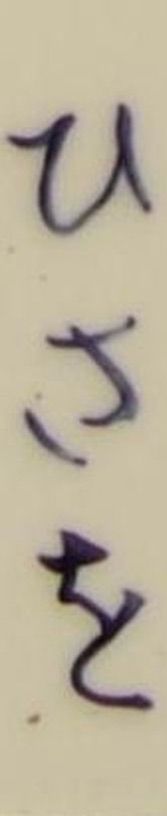ひさを
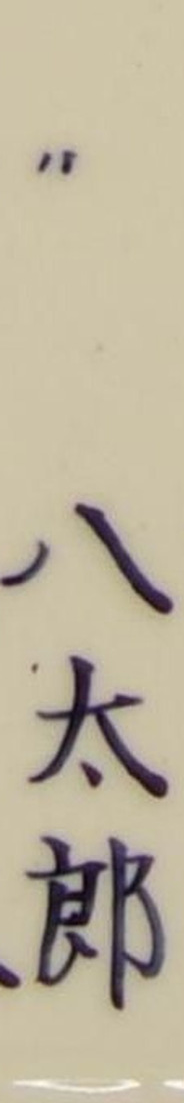八太郎
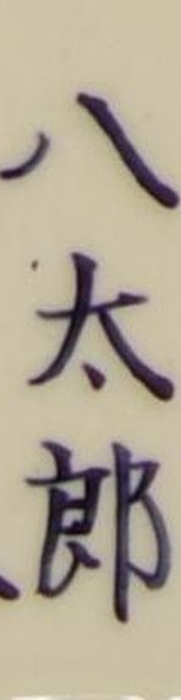八太郎
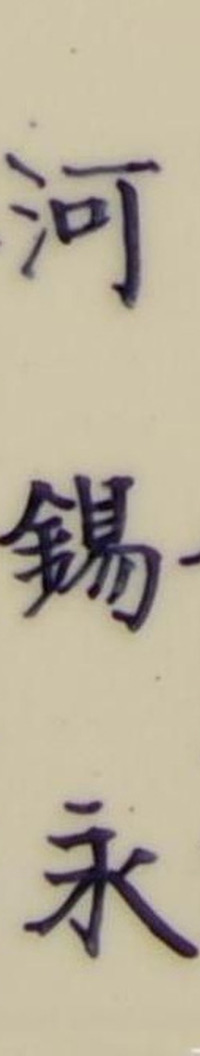河錫永
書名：E~L
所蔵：高野山金剛峯寺
